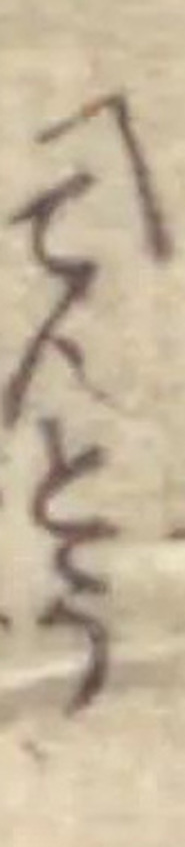〽てんとう
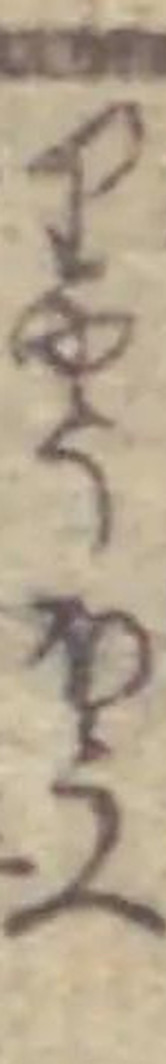りやうほうへ
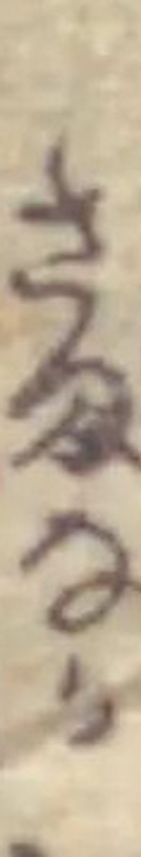さまなか
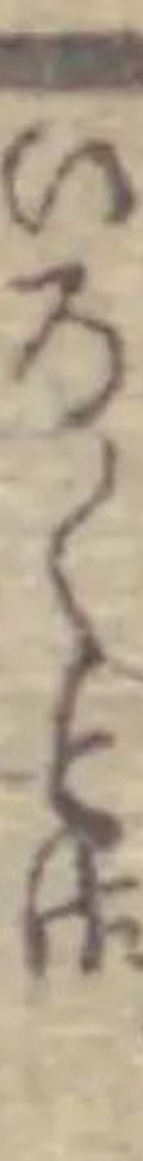いろ〳〵と御
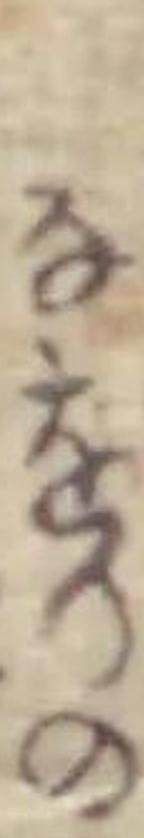なをりの
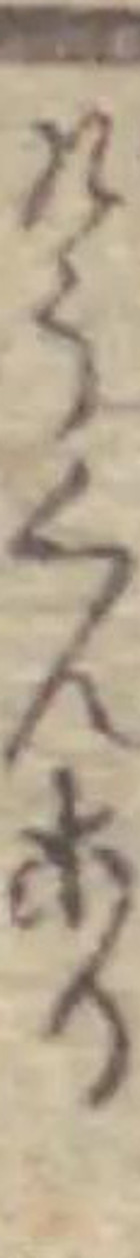けうくんあり
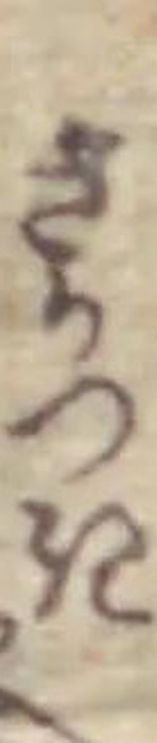さかつき
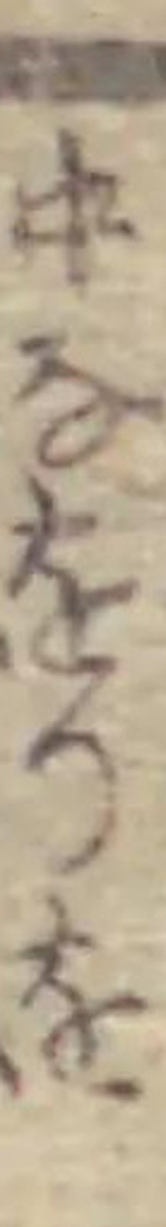中なをりを
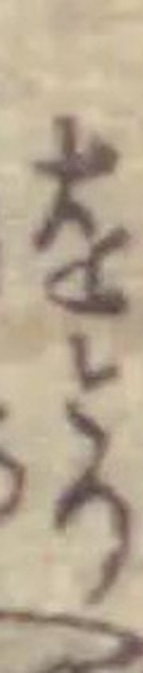をとり
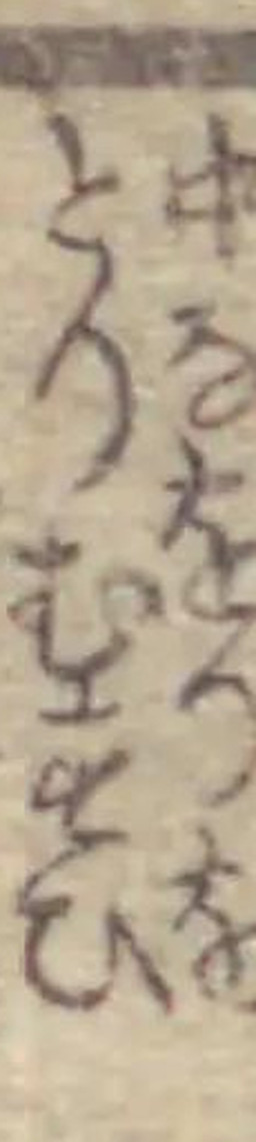とりむすひ
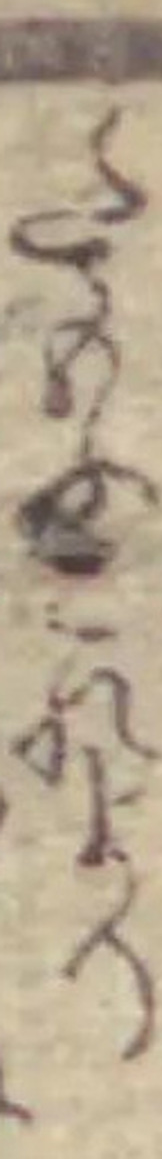たもふこれより
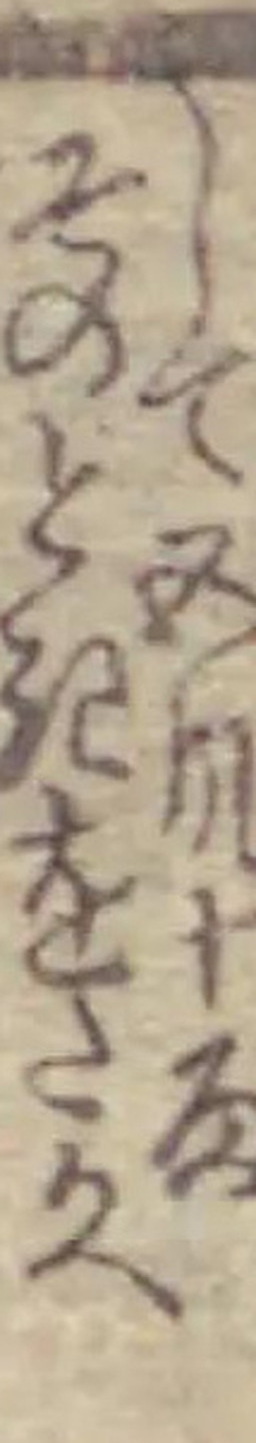そのときをたかへ
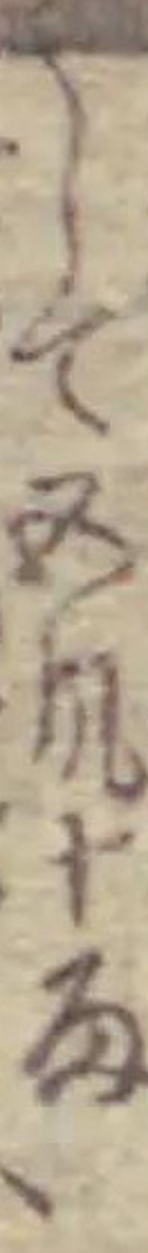して五風十雨
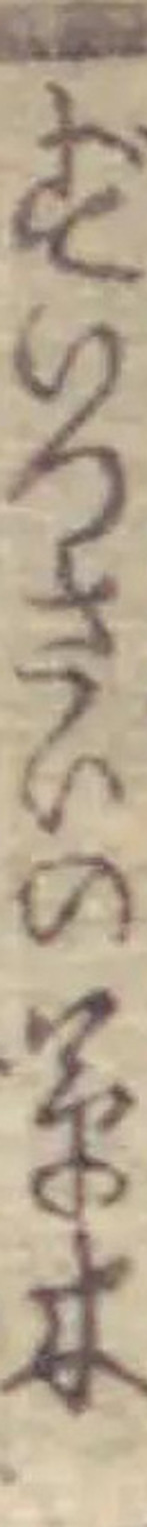ずいつさいの草木
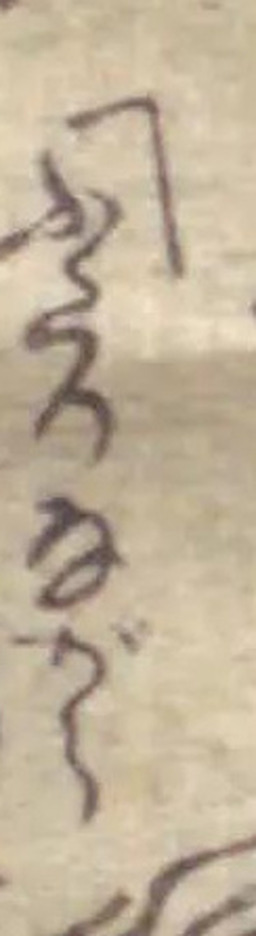〽ふたりながら
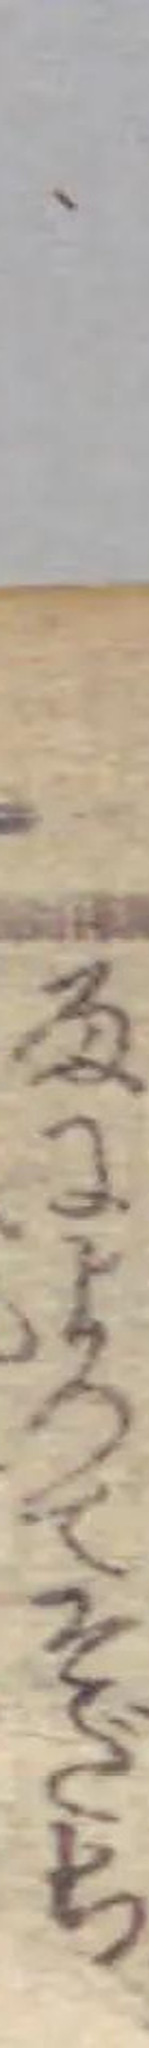雨によつてそだち
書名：雨宮風宮出儘略縁記 3巻
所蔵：国立国会図書館 National Diet Library, JAPAN
